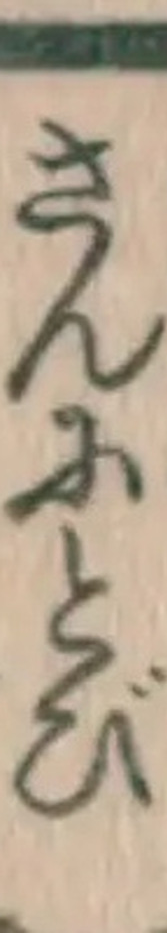さんにとび
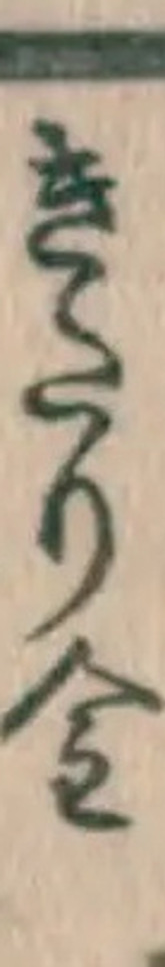きたり金
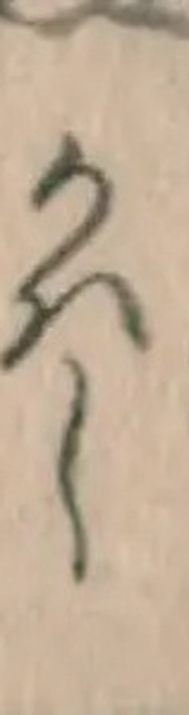かはし
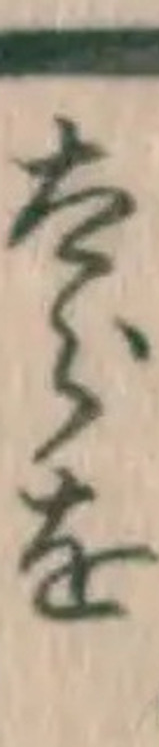太郎を
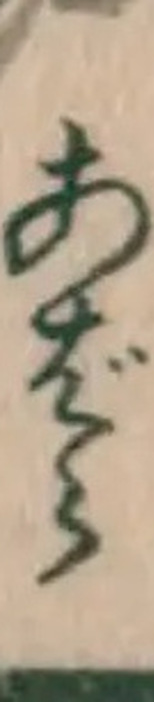あばら
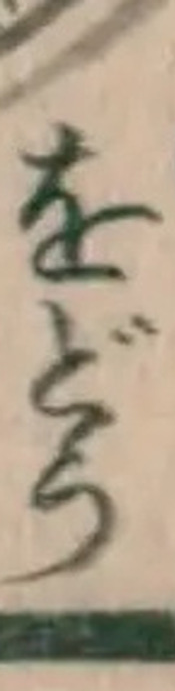をどう
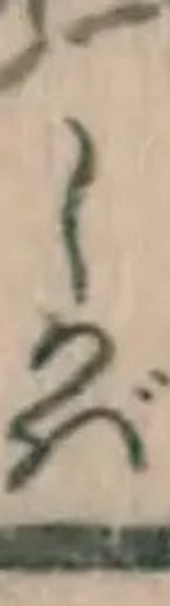しかば
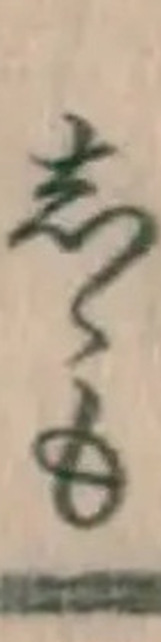しゝも
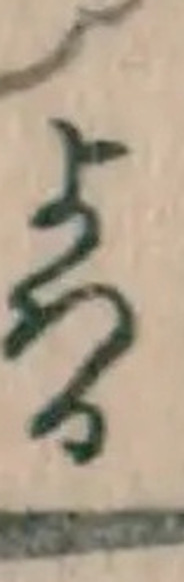よはる
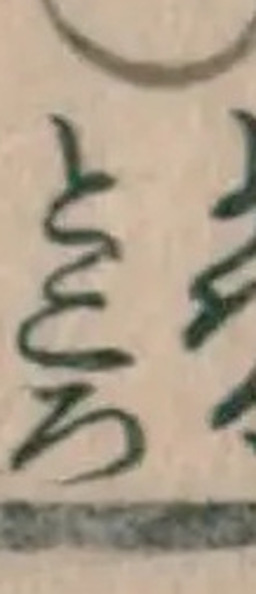ところ

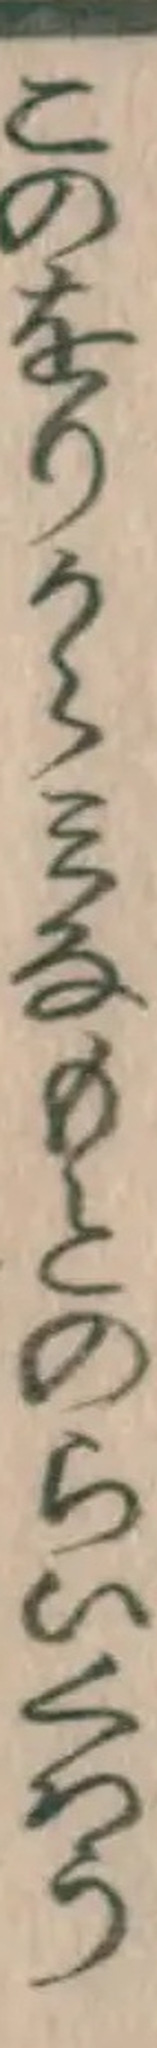このをりからみなもとのらいくはう
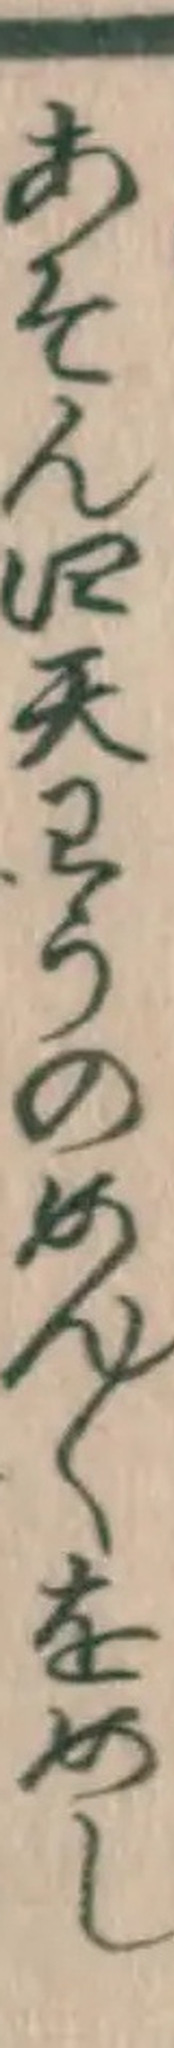あそん四天わうのめん〳〵をめし
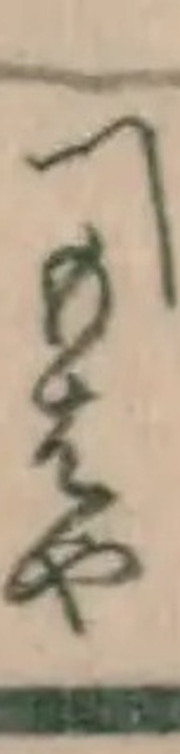〽もはや
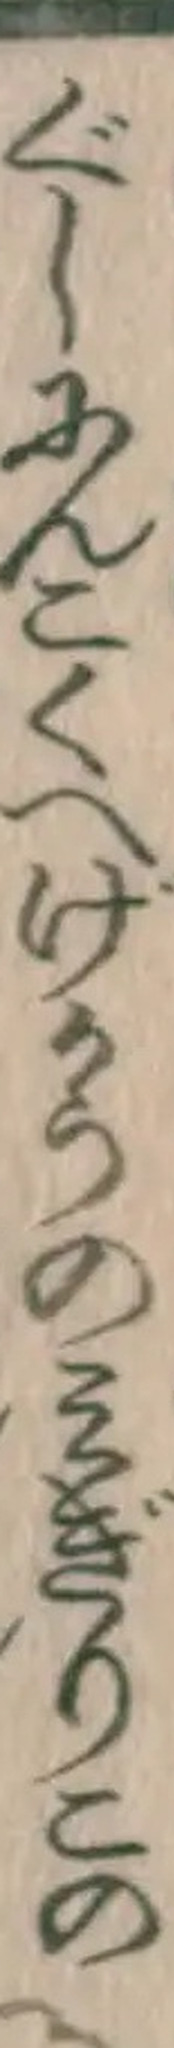ぐしにんこくへげかうのみぎりこの
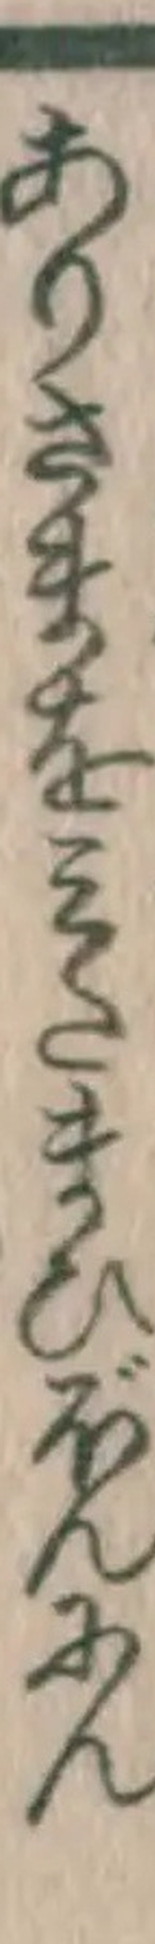ありさまをみたまひぼんにん
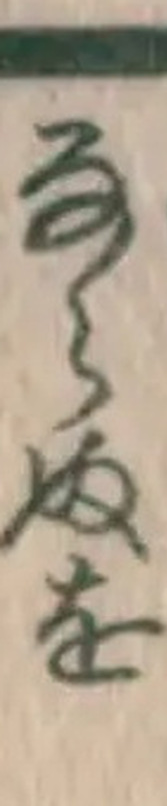ならぬを
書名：金太郎
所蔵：国立国会図書館 National Diet Library, JAPAN
